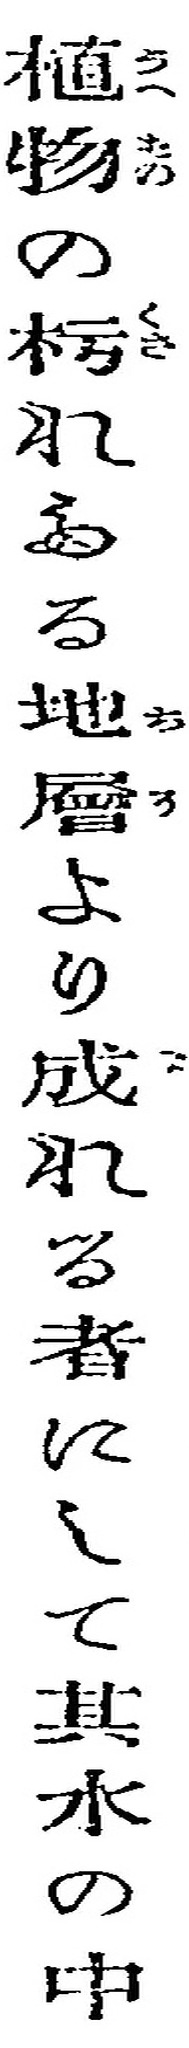植物の朽れたる地層より成れむ者にして其水の中
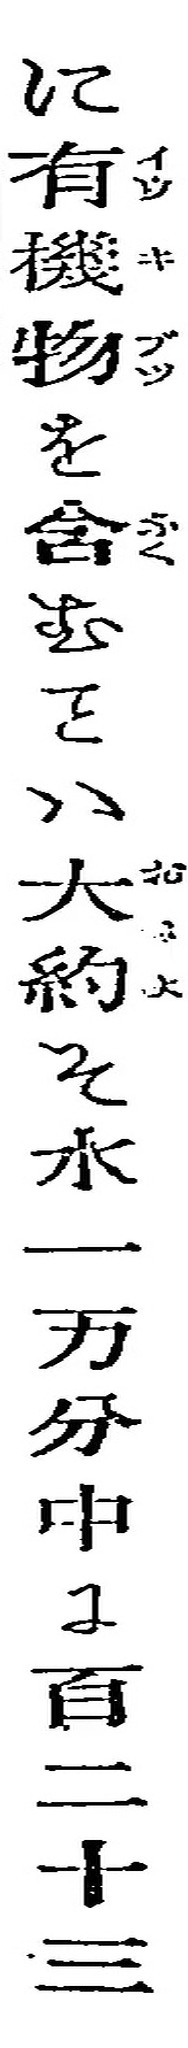に有機物を含むことは大約そ水一万分中に百二十三
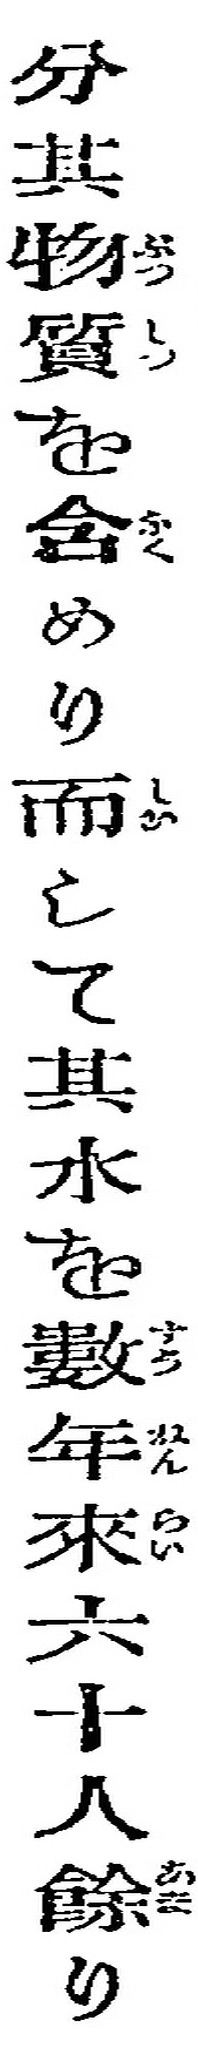分其物質を含めり而して其水を数年來六十人餘り

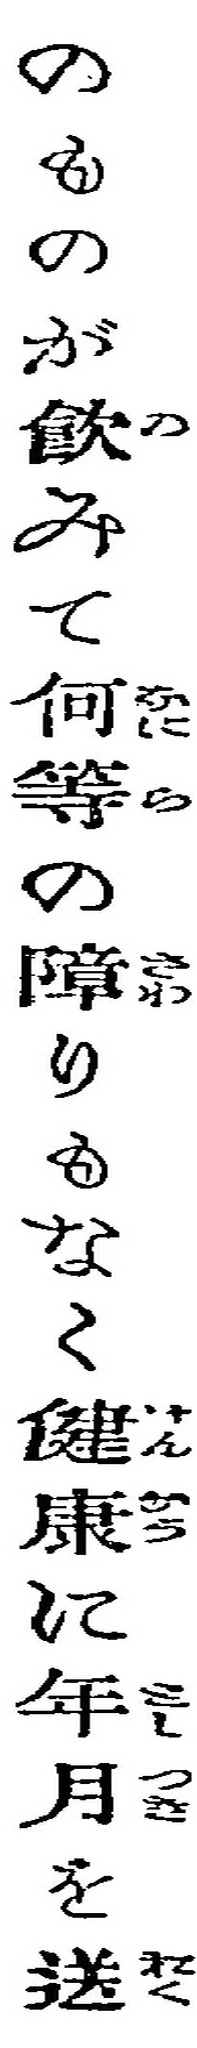のものが飲みて何等の障りもなく健康に年月を送
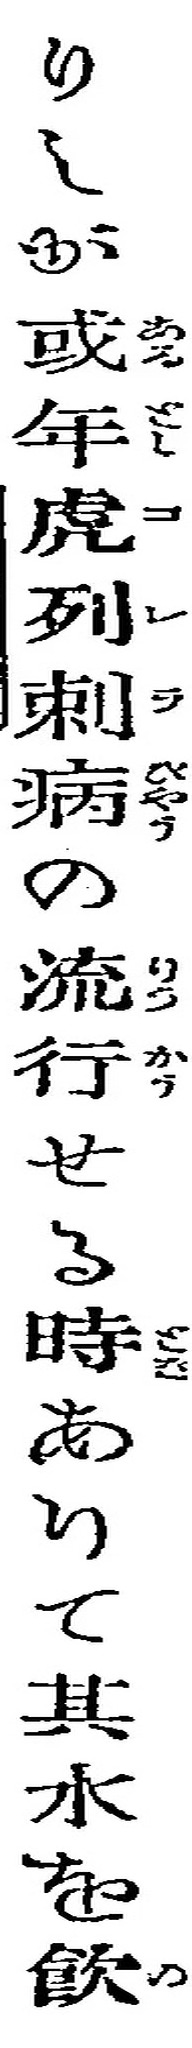りしが或年虎列刺病の流行せる時ありて其水を飲
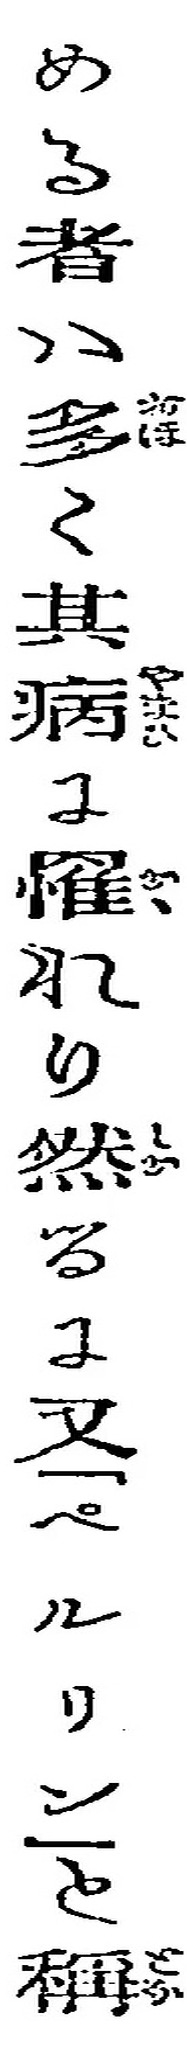める者は多く其病に罹れり然るに又「ペルリン」と稱
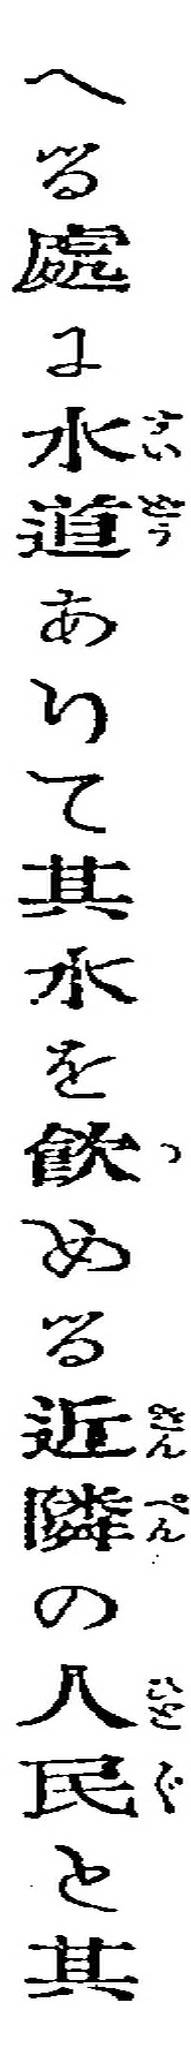へる處に水道ありて其水を飲める近隣の人民と其の
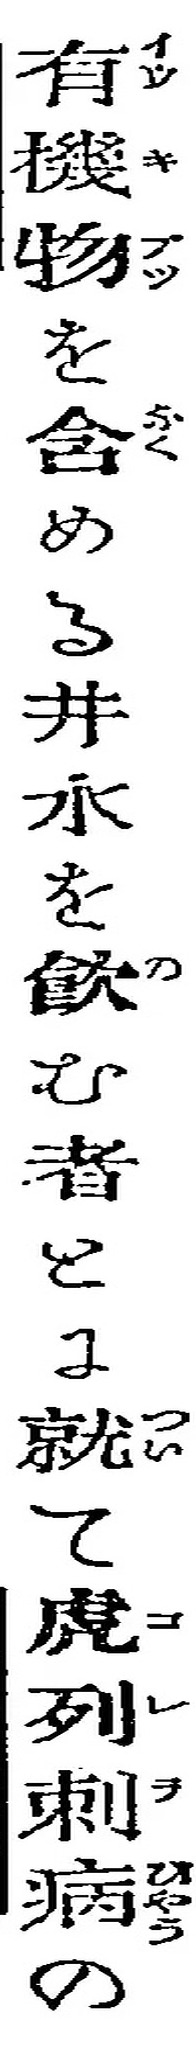有機物を含める井水を飲む者とに就て虎列刺病の
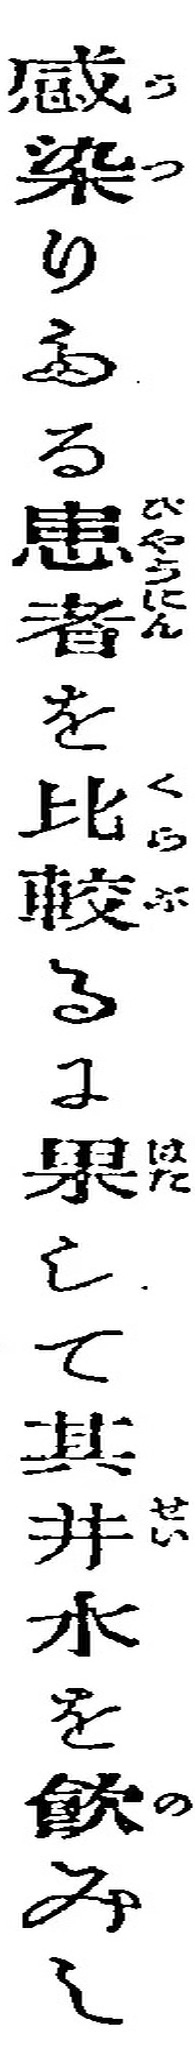感染りたる患者を比較るに果して其井水を飲みし
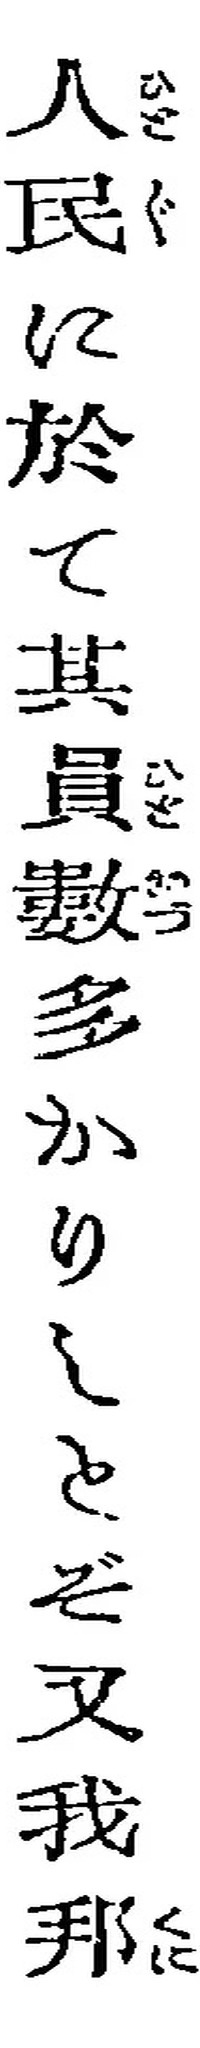人民に於て其員数多かりしとぞ我邦
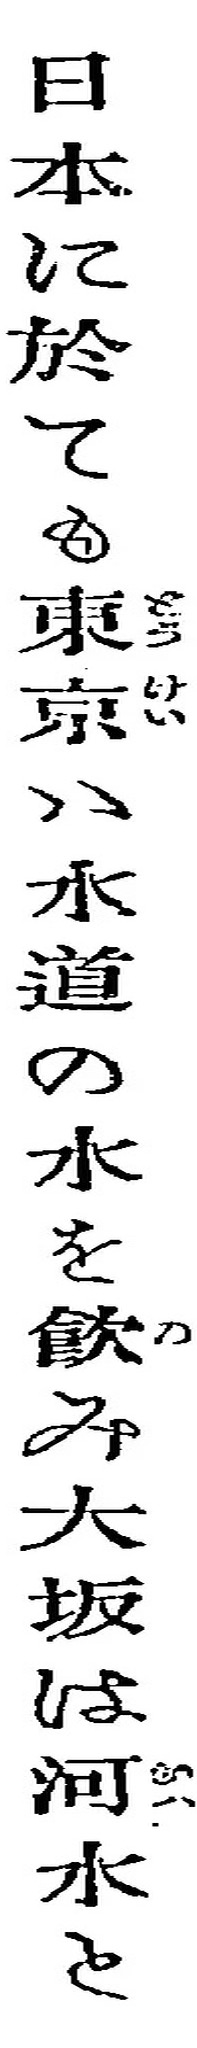日本に於ても東京は水道の水を飲大坂は河水と
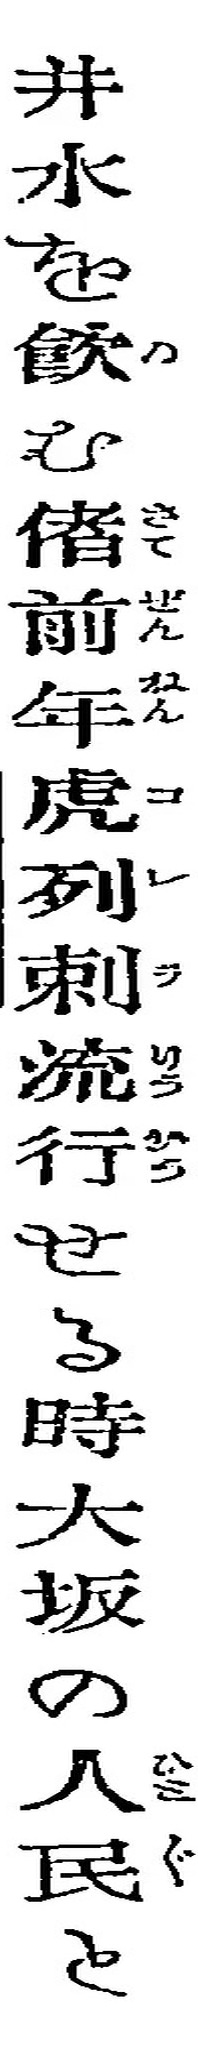井水を飲む偖前年虎列刺流行せる時大坂の人民と
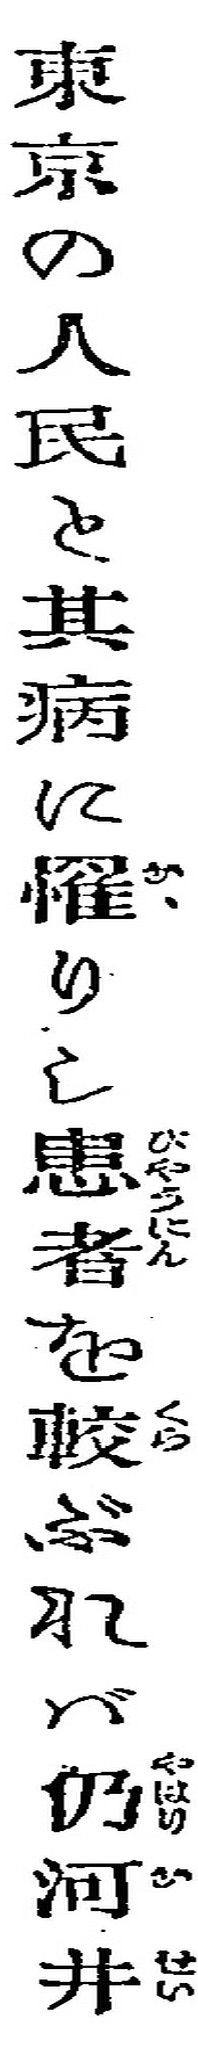東京の人民と其病に罹りし患者を較ぶれば仍河井
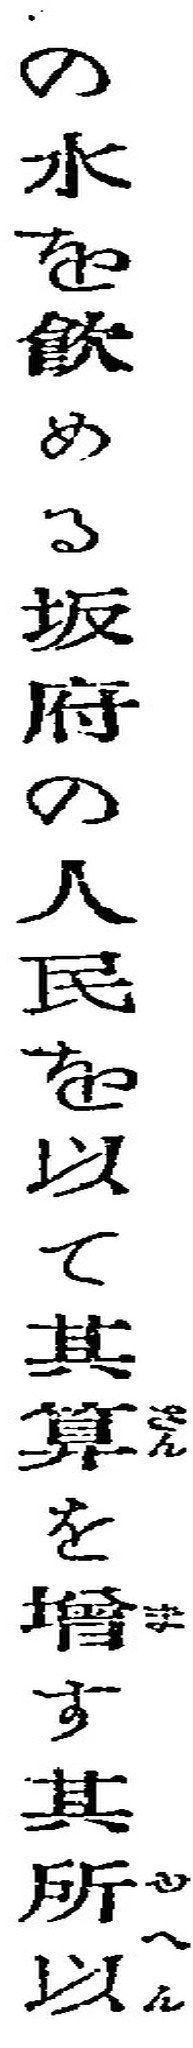の水を飲める坂府の人民を以て其算を増す其所以
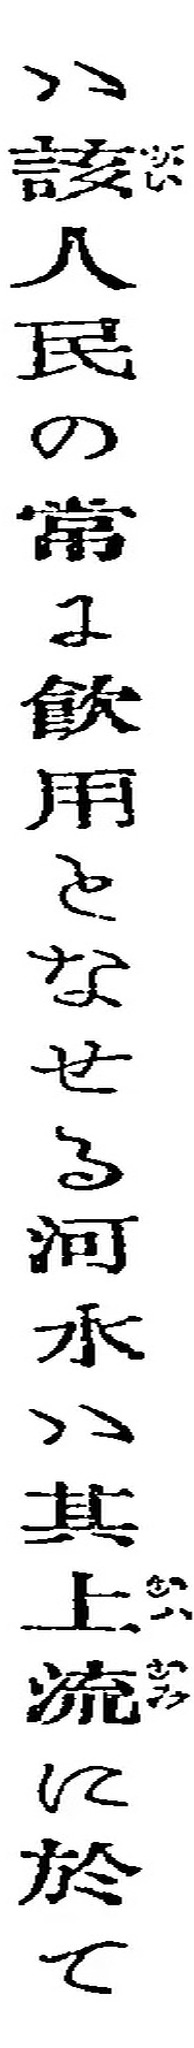は該人民の常に飲用となせる河水は其上流に於て
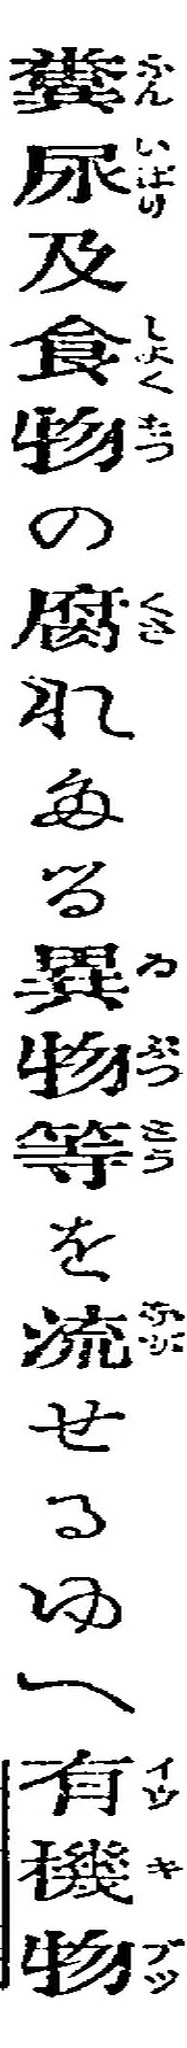糞尿及食物の腐れたる異物等を流せるゆへ有機物
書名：飲水の心得 : 伝染病の予防
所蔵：国立国会図書館 National Diet Library, JAPAN
